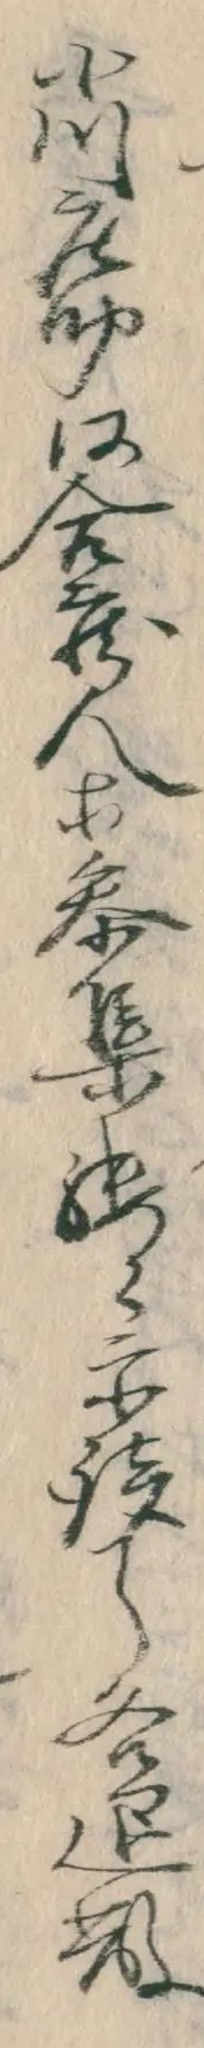小川庄助河合蔵人等参集能々示談了各退散
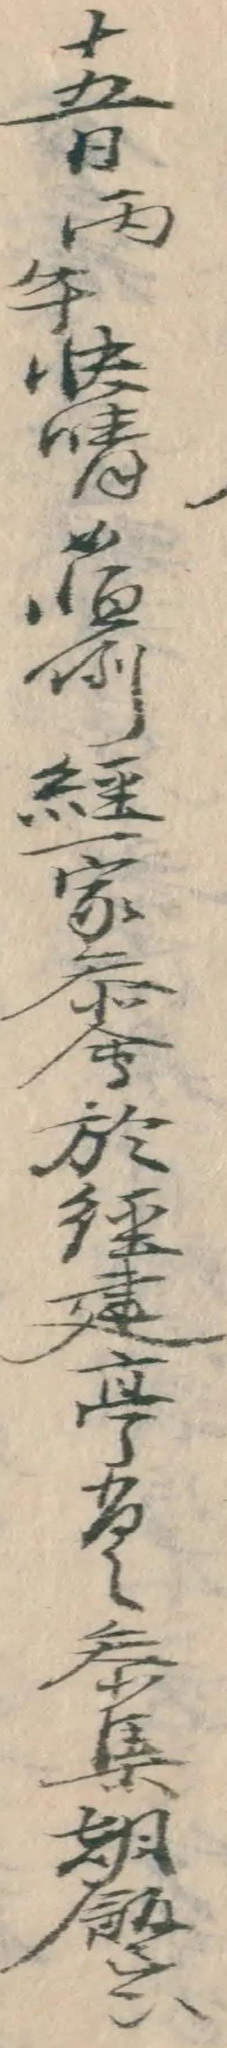十五日丙午快晴如恒例経一家参會於経建亭有之参集朝飯を以

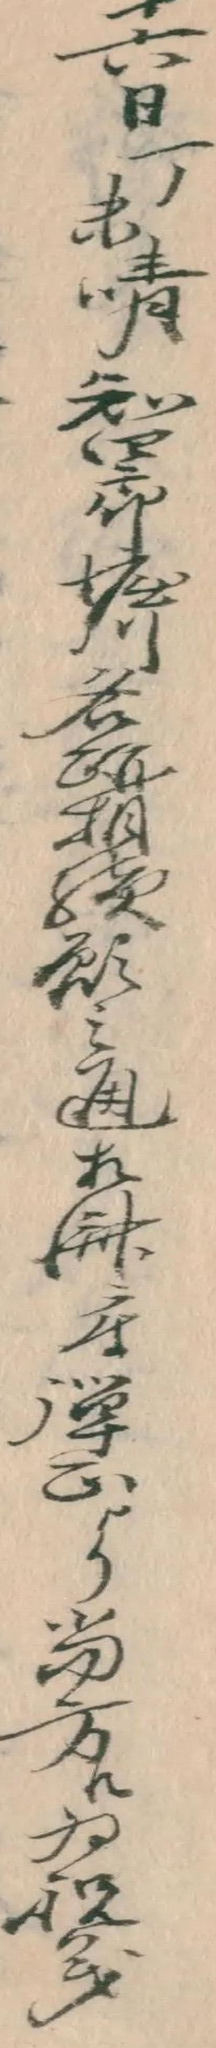十六日丁未晴知四郎堀川名跡相續願之通相済ニ付弾正より當方え為祝義
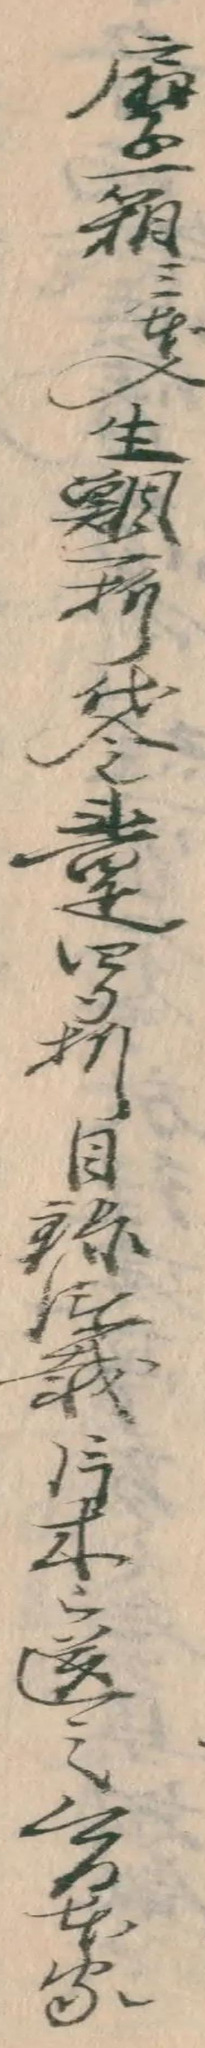扇子一箱三本入生鯛一折代金弐百疋四ツ折目録添載片木被送之今日本家
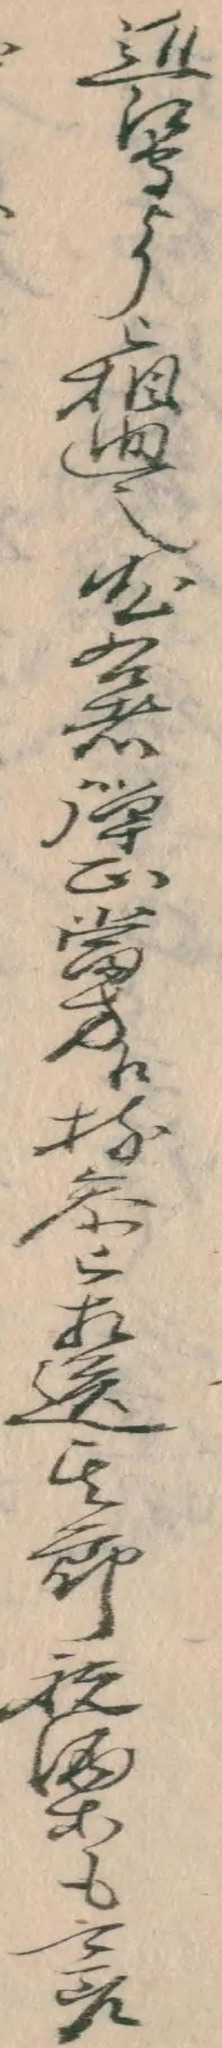近江守より被相廻也尤右は弾正當方え持参被相送其節祝酒等も可差
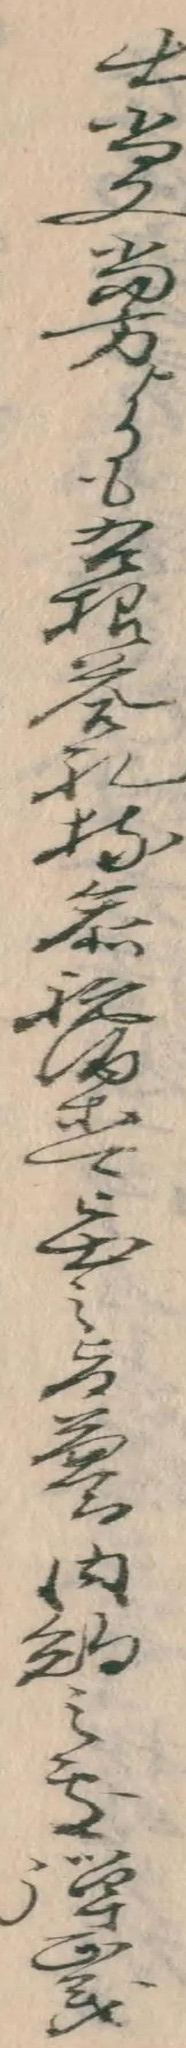出尚又當方よりも右様答礼持参祝泊等可被出之旨兼而内約之處弾正義
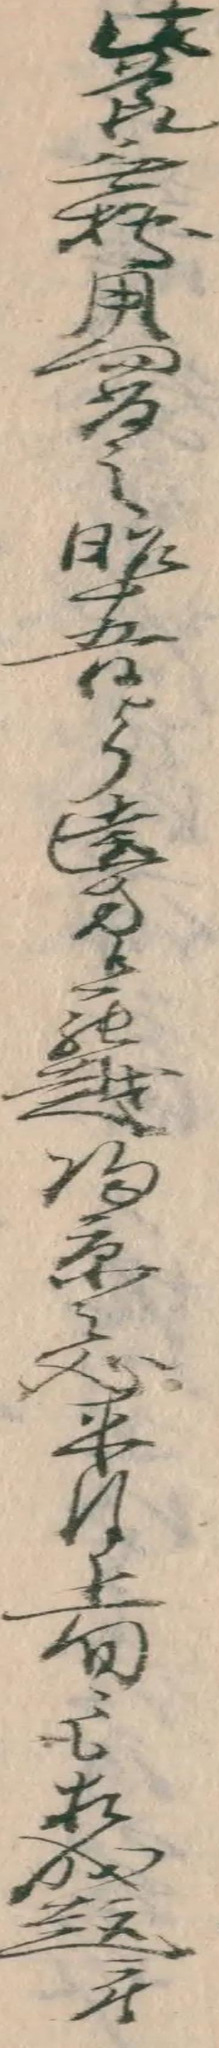此節無披用向有也昨十五日より遠方え罷越帰京之処来月上旬ニも相成趣ニ付
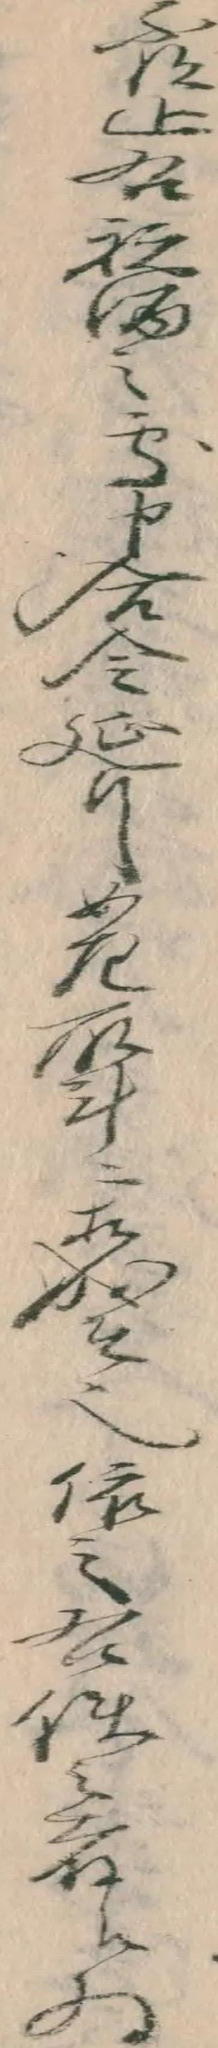不従止右祝酒之處申合令延引如左右斗に相成者也依之右件之者え為
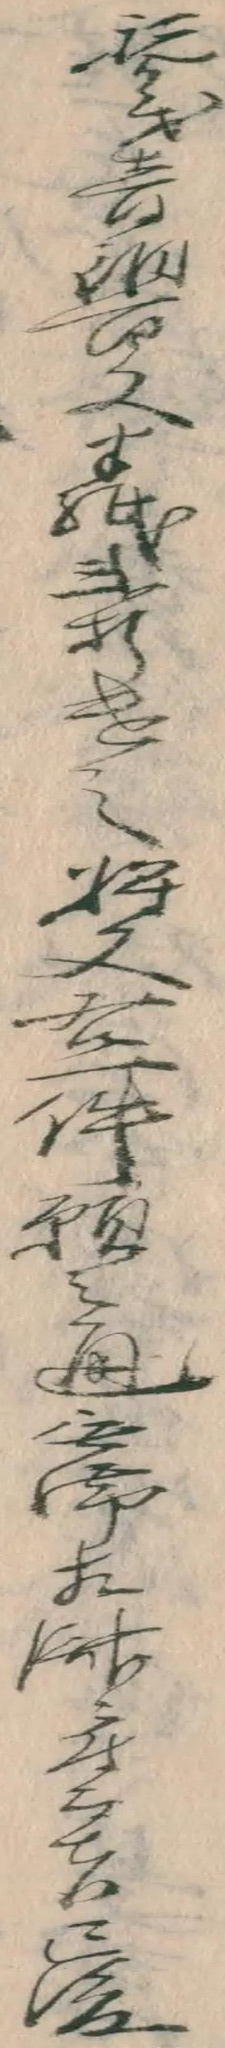祝儀肴調百文半紙弐折遣之将又右一件願之通無滞相済ニ付而は已後
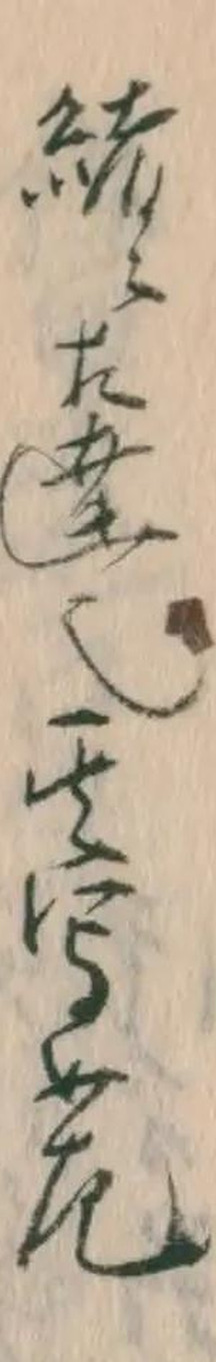緒ニ相達也其写如左
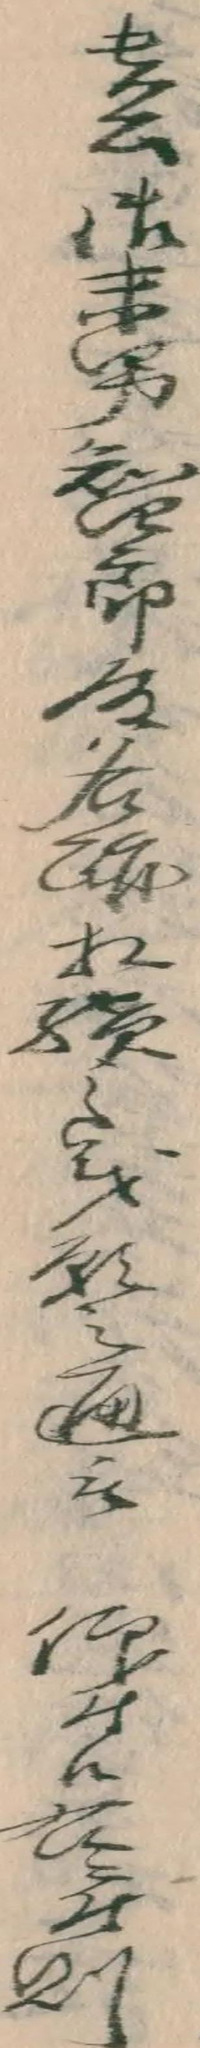貴公御未男知四郎殿名跡相續之義願之通被仰付候趣ニ付則
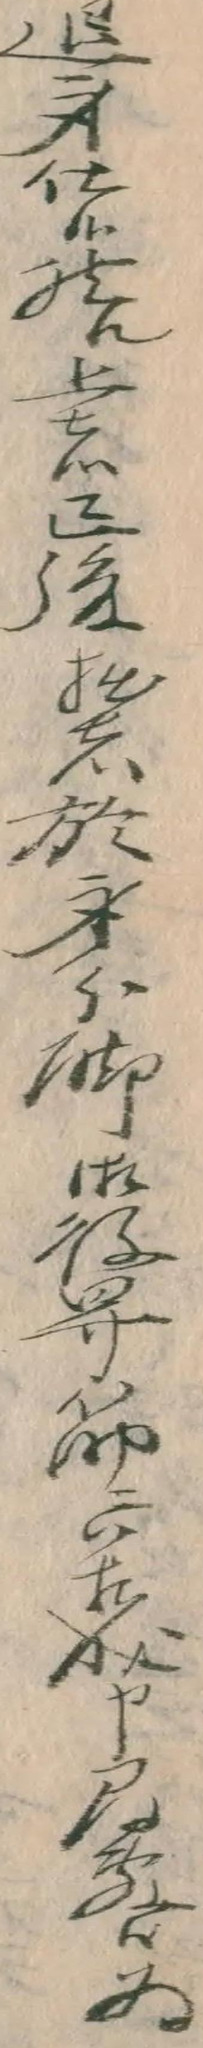退身仕候然ル上者已後拙者於身分聊御役界筋ニ候相成申間敷候為
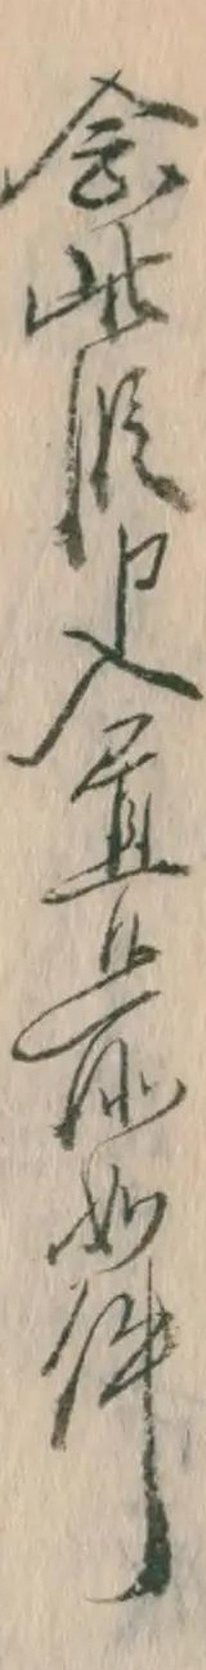念此段申入置候所如件
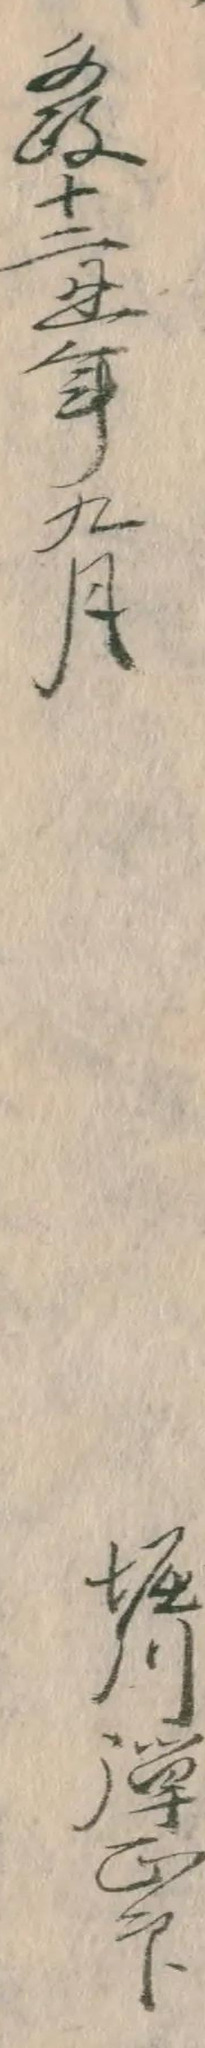文政十二丑年九月堀川弾正印
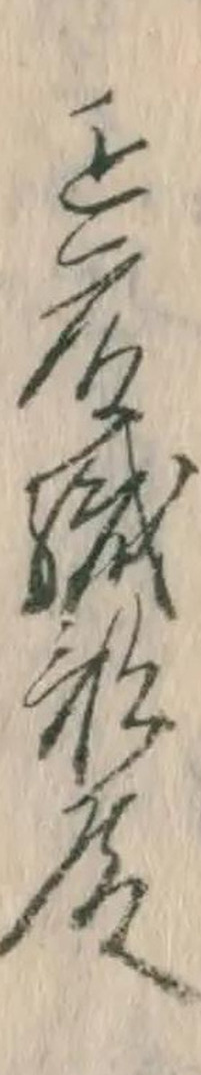近藤織部殿
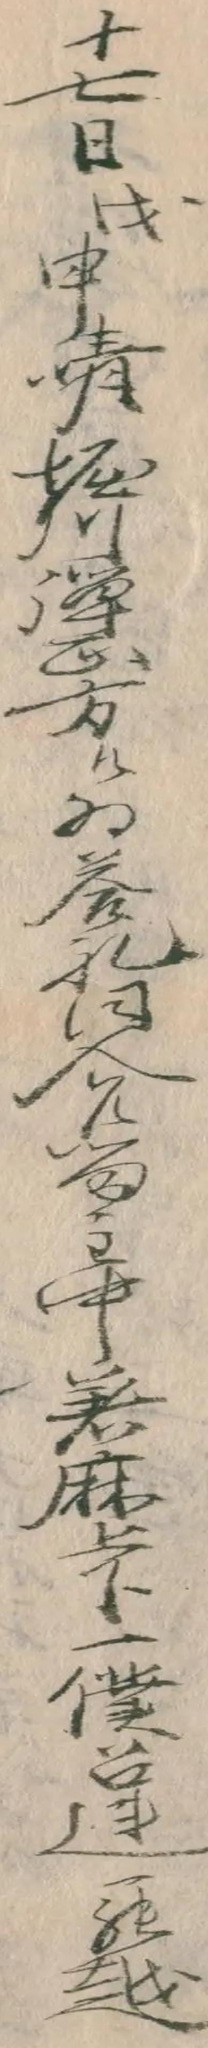十七日戊申堀川弾正方え為答札同人差留主中着麻上下一僕召連罷越
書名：賀茂社記録. 第65冊
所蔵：国立国会図書館 National Diet Library, JAPAN
